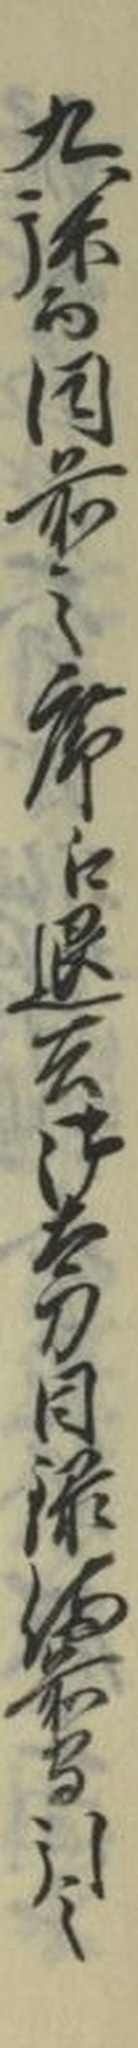九拝而同前之席え退去御太刀目録備前守引之
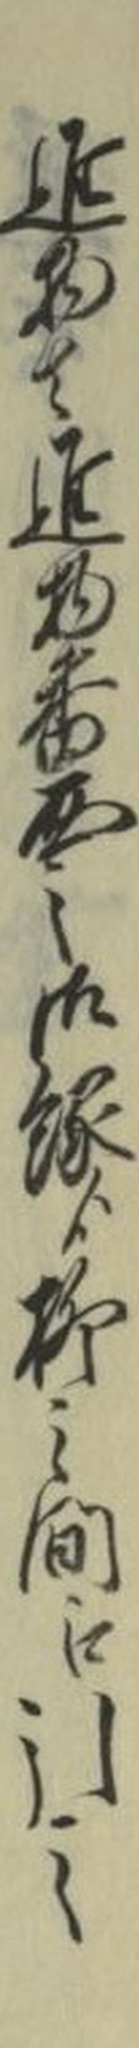進物は進物番西之御縁ゟ柳之間え引之
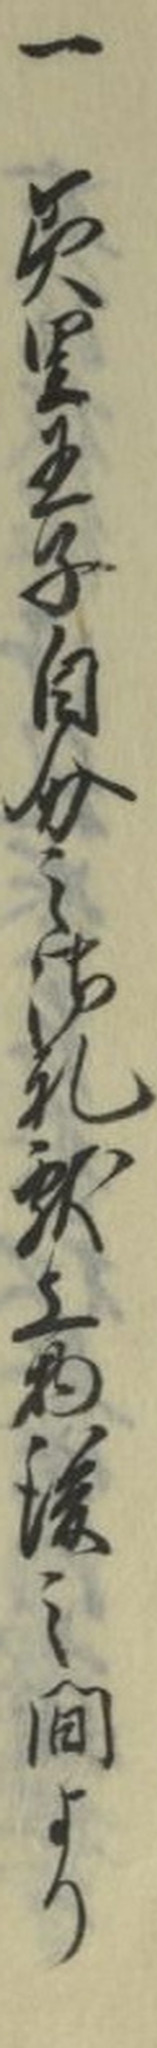一美里王子自分之御礼献上物後之間より
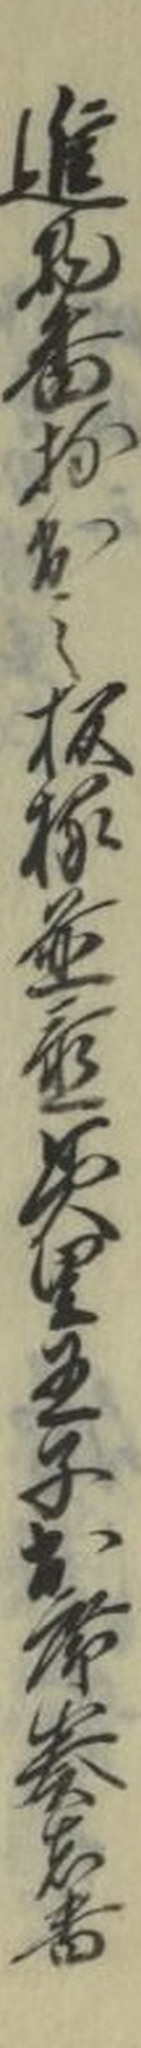進物番持出之板縁並置美里王子出席奏者番
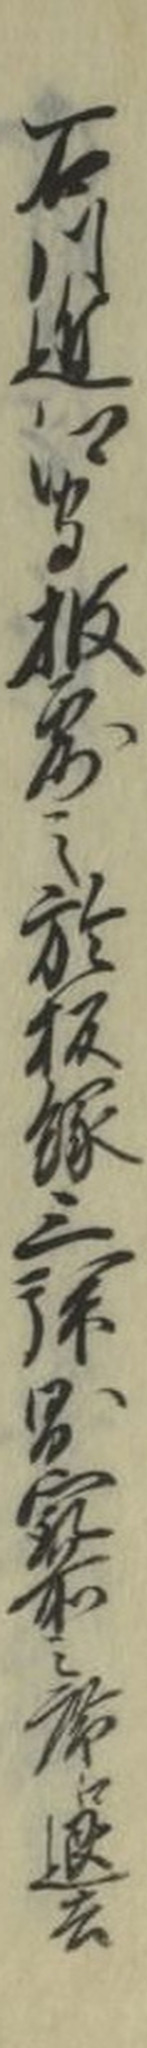石川近江守披露之於板縁三拝則最前之席え退去
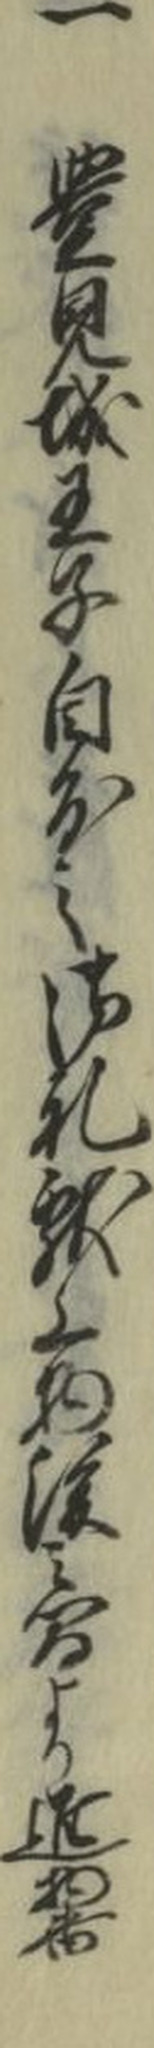一豊見城王子自分之御礼献上物後之間より進物番
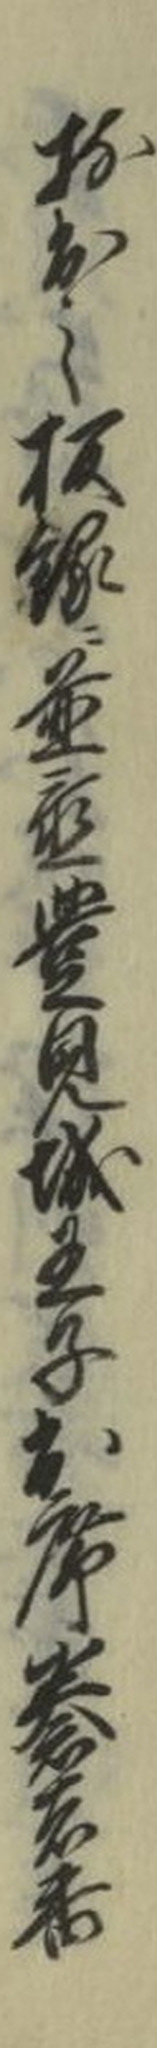持出之板縁に並置豊見城王子出席奏者番

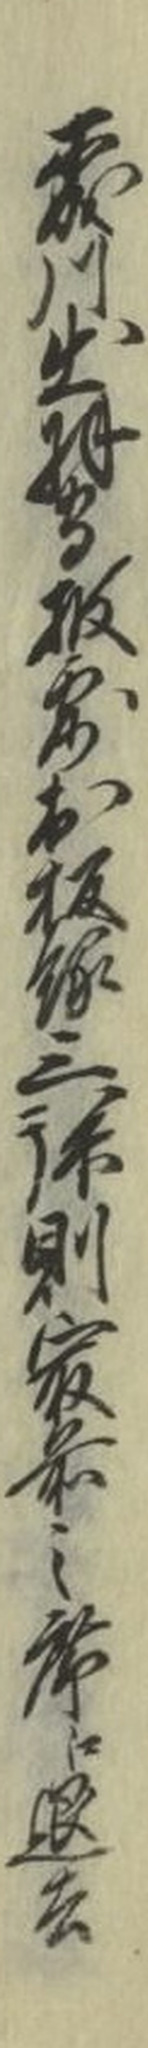森川出羽守披露出板縁三拝則最前之席え退去
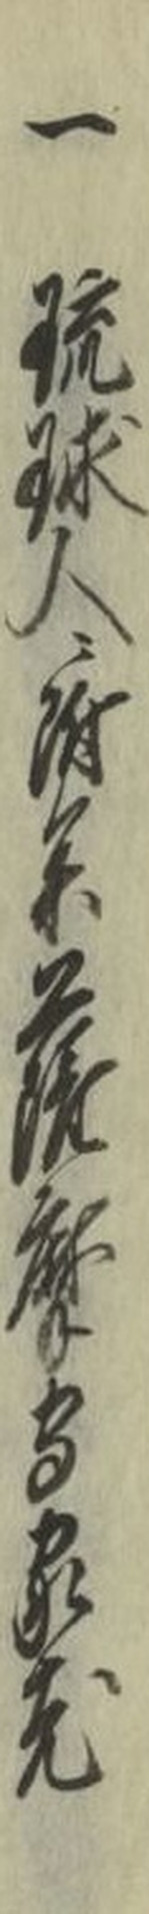一琉球人に附参薩摩守家老
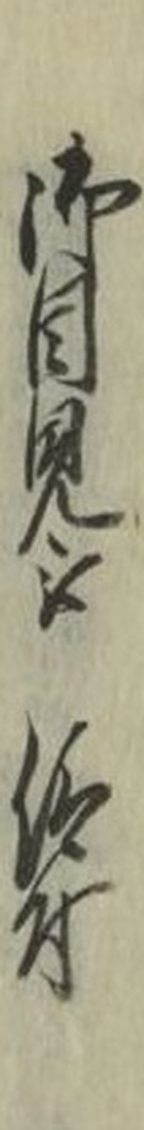御目見被仰付
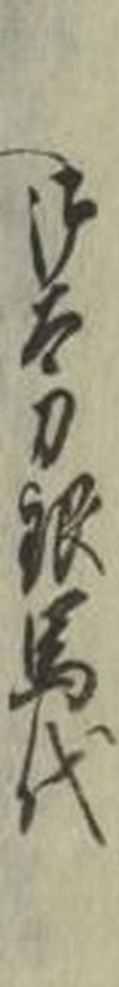御太刀銀馬代
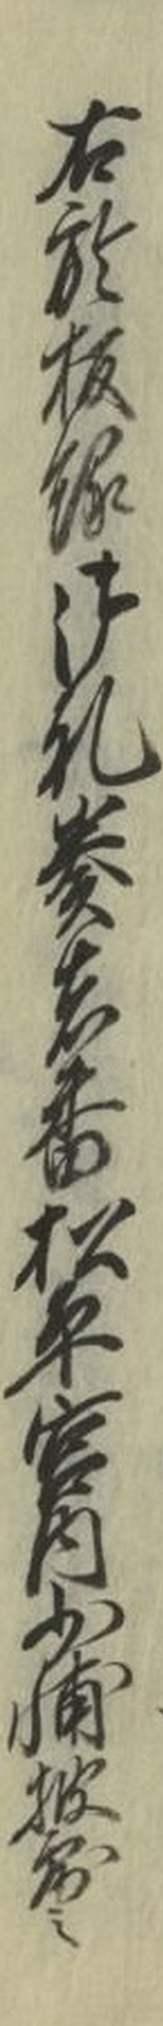右於板縁御礼奏者番松平宮内少輔披露之
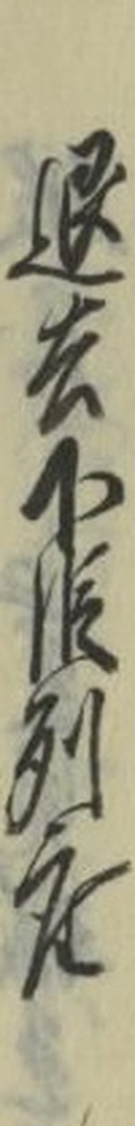退去下段列座
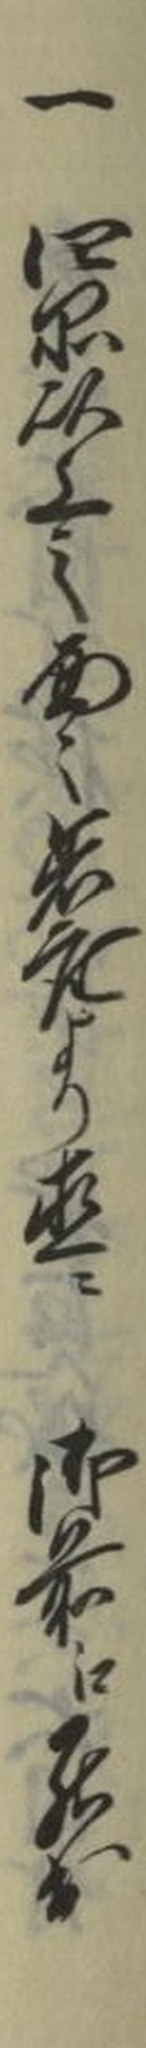一四品以上之面々着座より直に御前え罷出
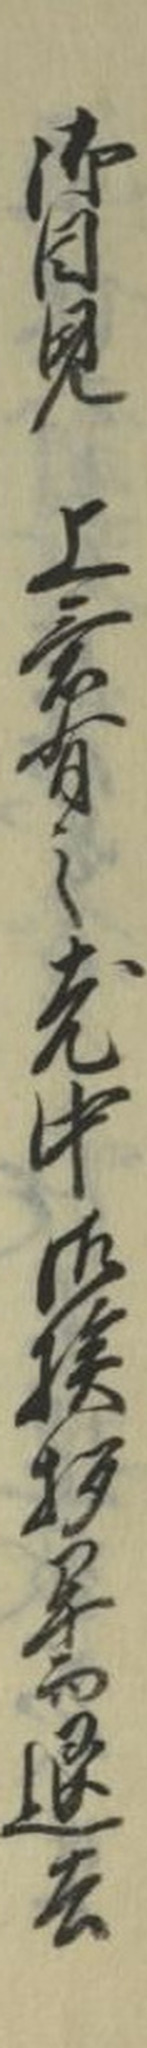御目見上意有之老中御挨拶畢而退去
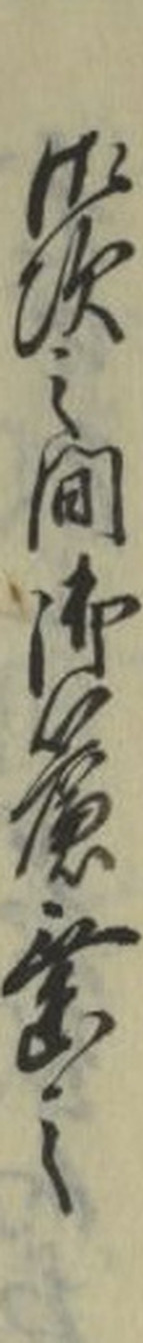御次之間御簾垂之
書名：琉球人参府記
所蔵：University of the Ryukyus Library
